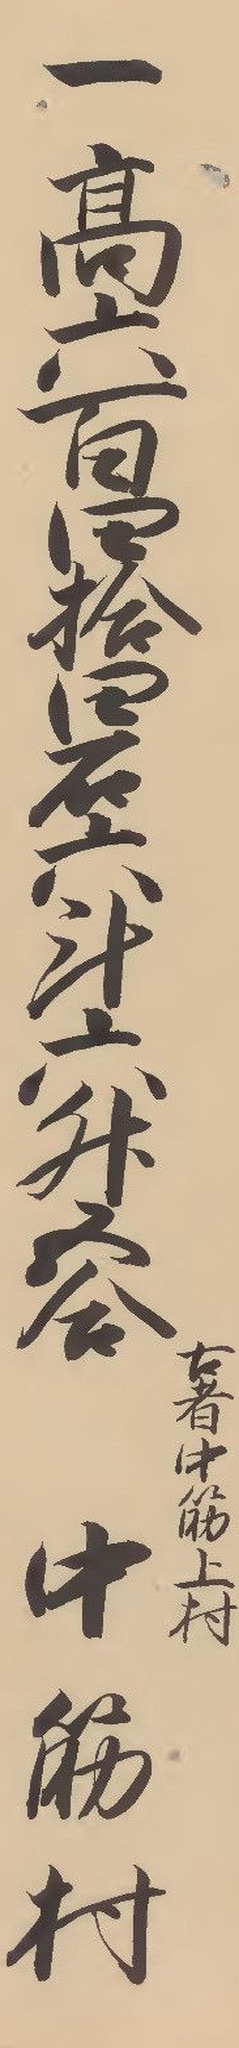一高六百四拾四石六斗六升五合中筋村
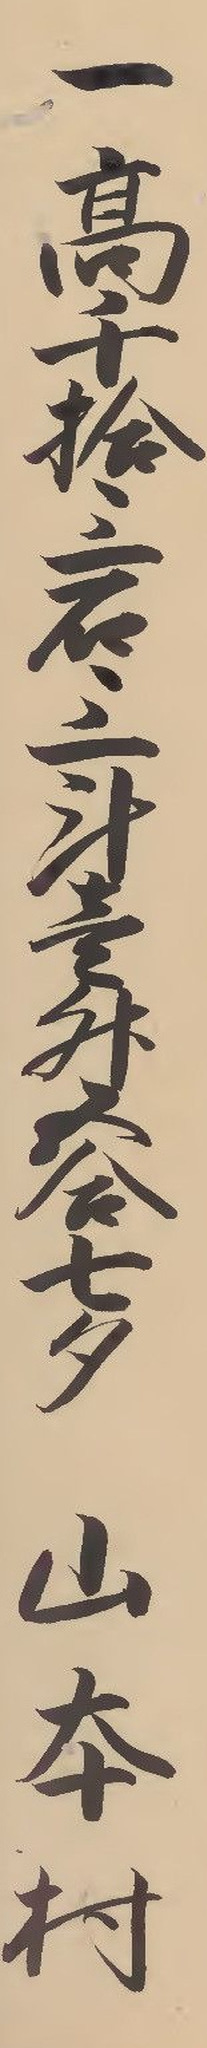一高千拾三石三斗壱升五合七勺山本村
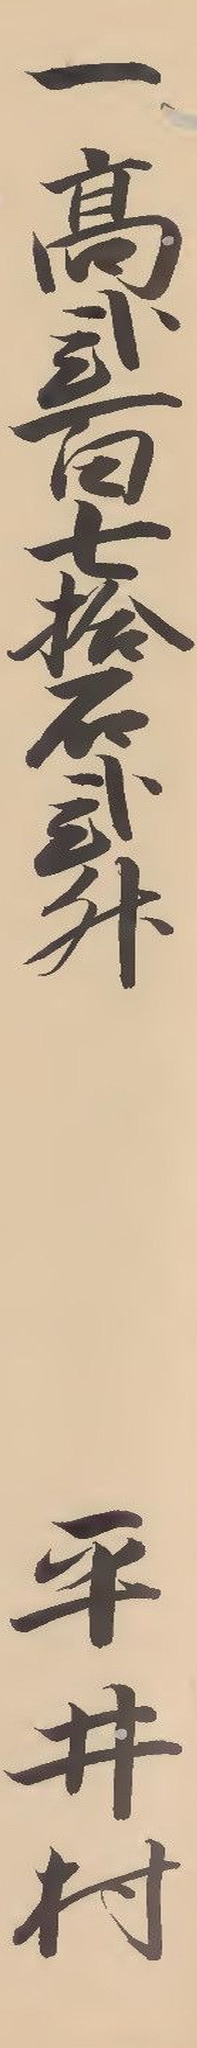一高弐百七拾石弐升平井村
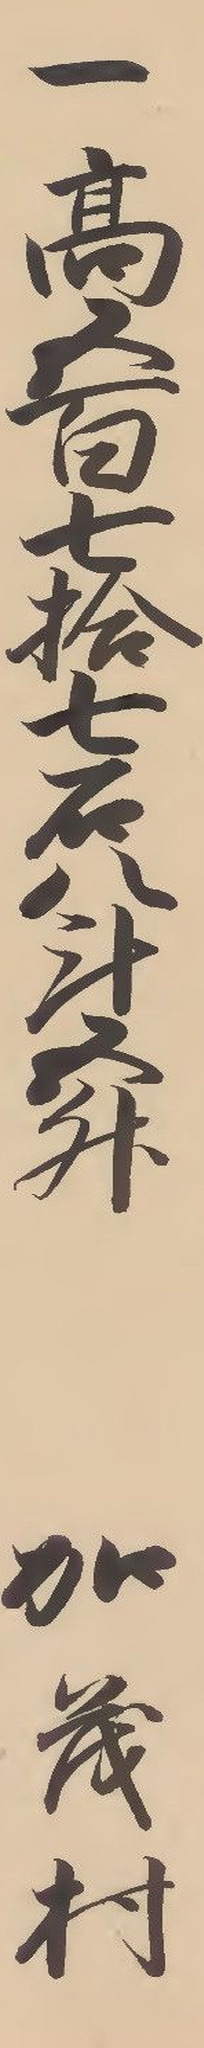一高五百七拾七石八斗五升加茂村
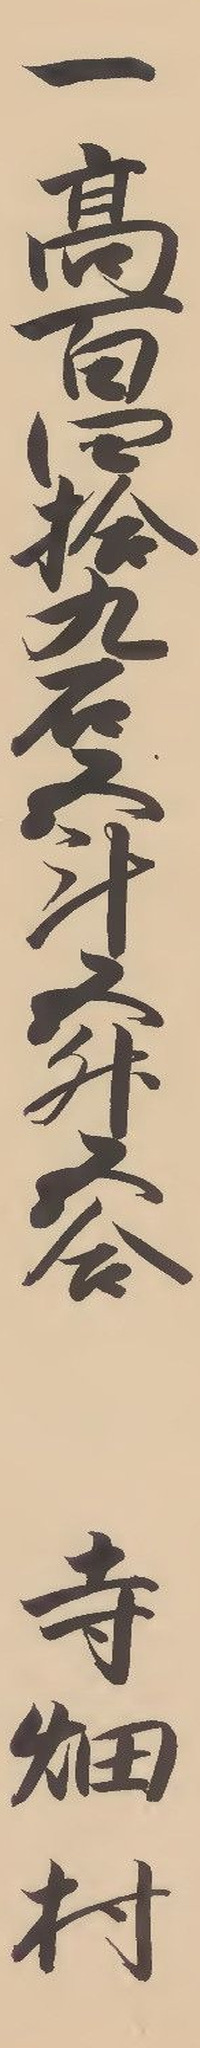一高百四拾九石五斗五升五合寺畑村
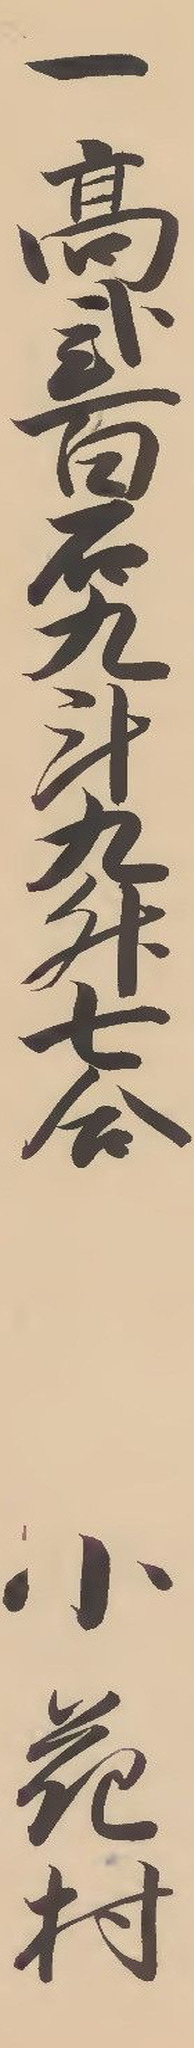一高弐百石九斗九升七合小花村

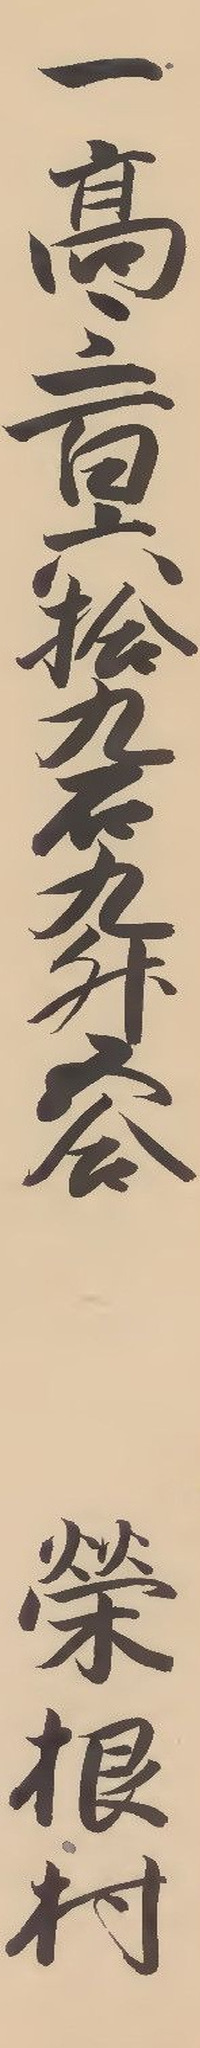一高三百六拾九石九升五合栄根村
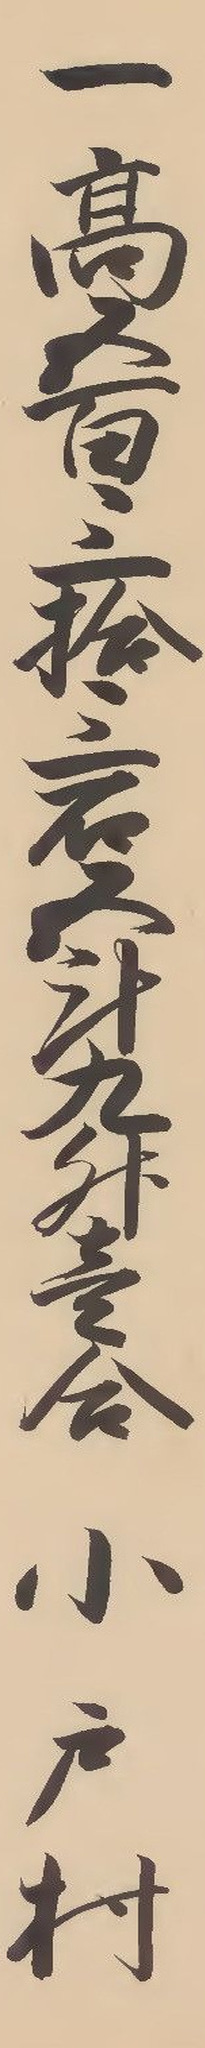一高五百三拾三石五斗九升壱合小戸村
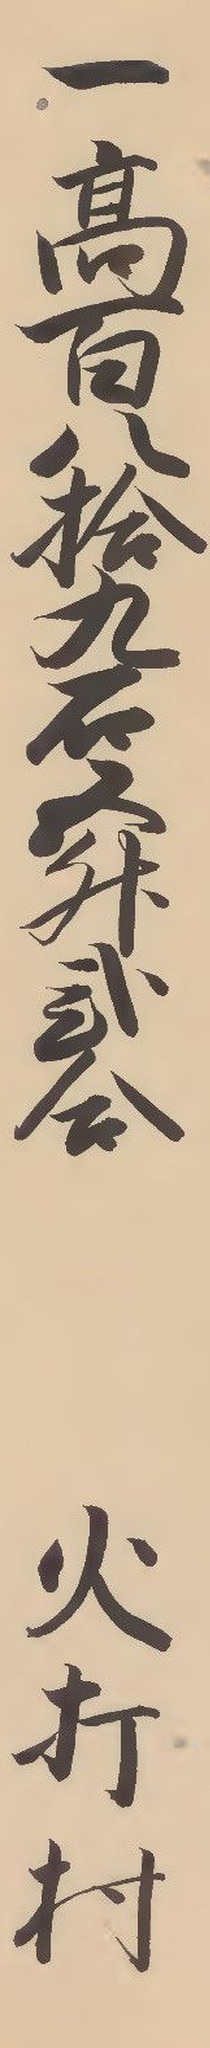一高百八拾九石五升弐合火打村
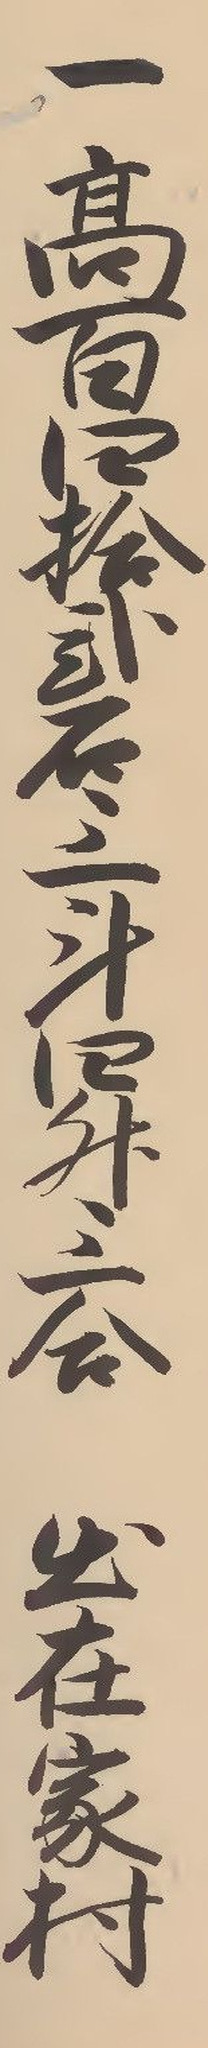一高百四拾弐石三斗四升三合出在家村
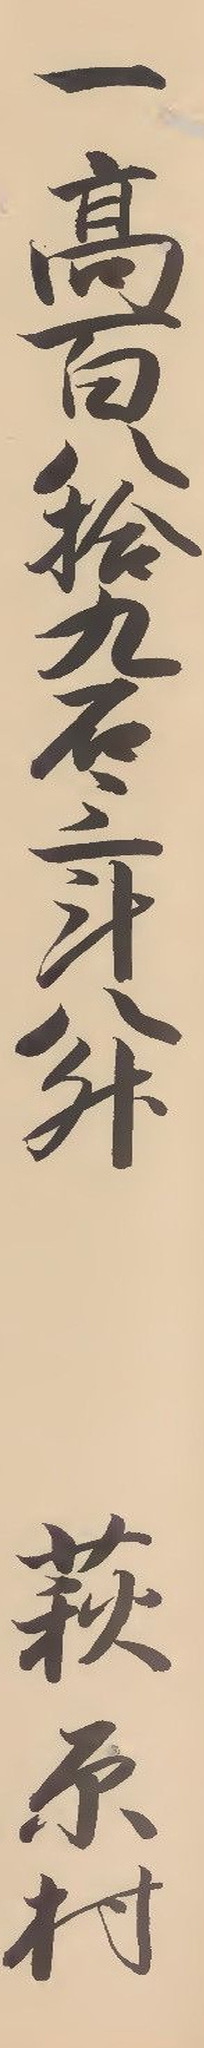一高百八拾九石三斗八升萩原村
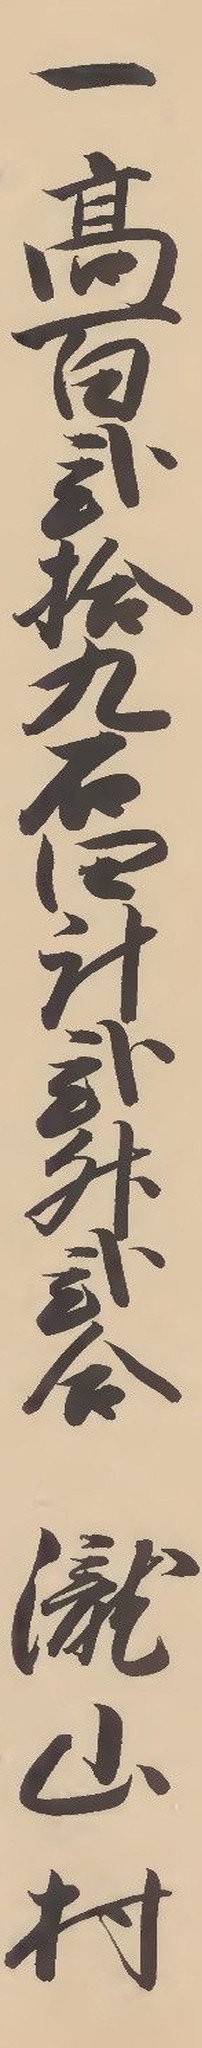一高百弐拾九石四斗弐升弐合滝山村
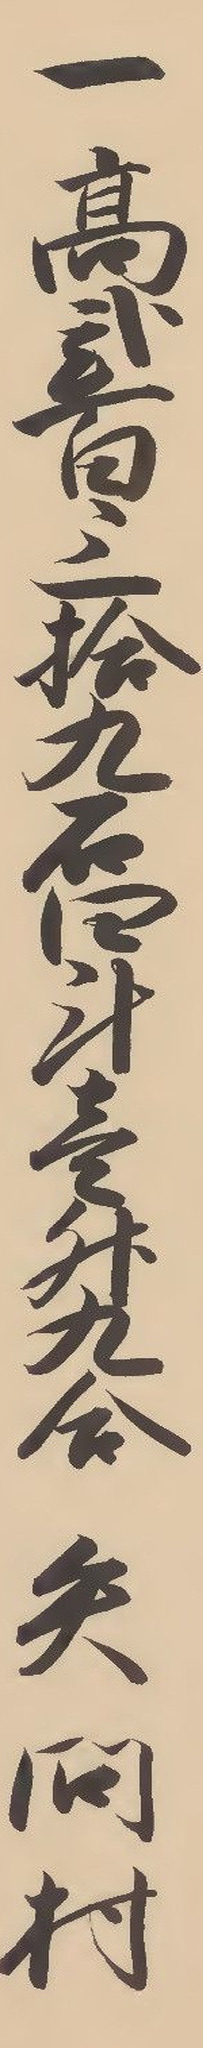一高弐百三拾九石四斗壱升九合矢問村
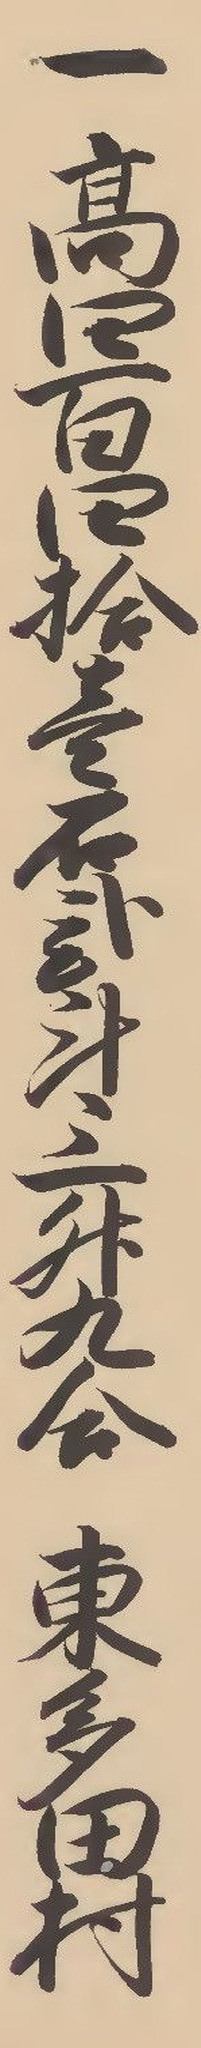一高四百四拾壱石弐斗三升九合東多田村

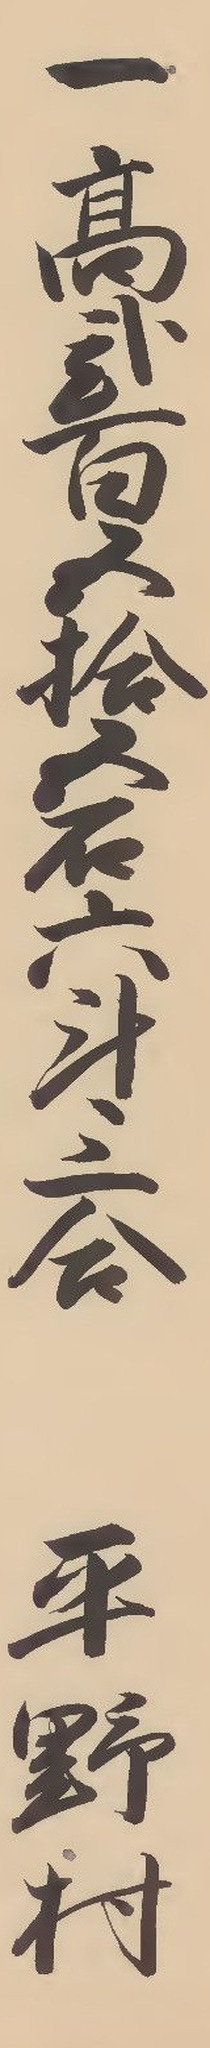一高弐百五拾五石六斗三合平野村
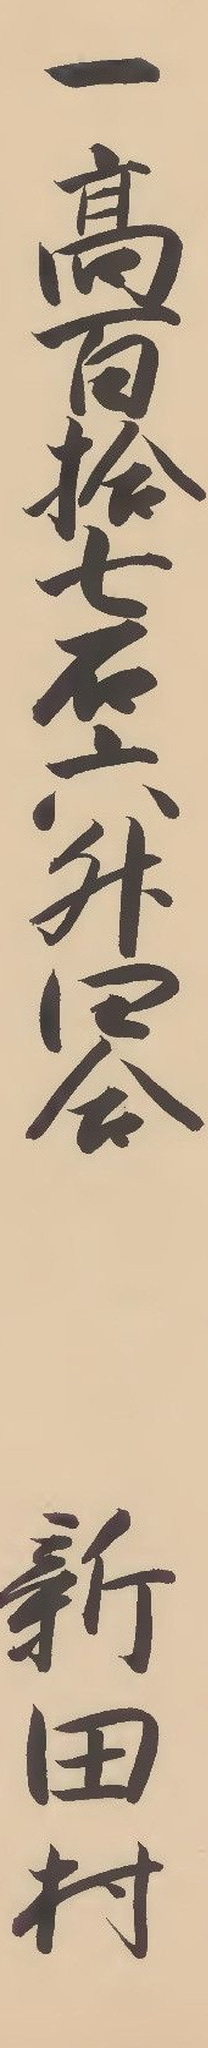一高百拾七石六升四合新田村
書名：摂津国郷帳
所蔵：国立公文書館 National Archives of Japan
